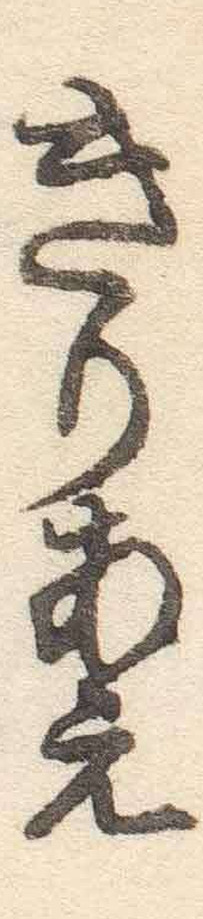きりあえ
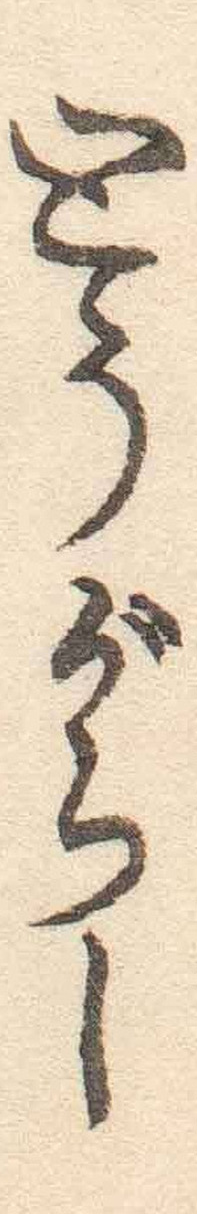とうがらし
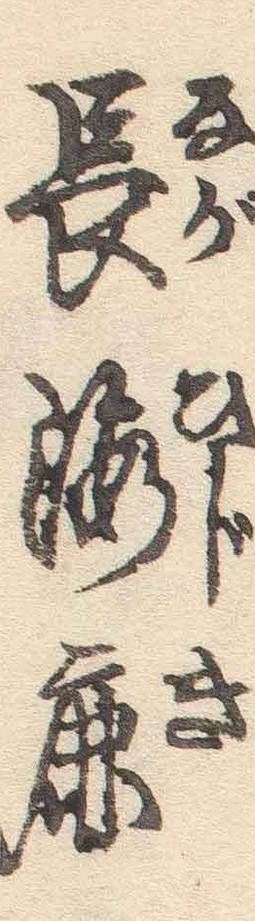長海鹿
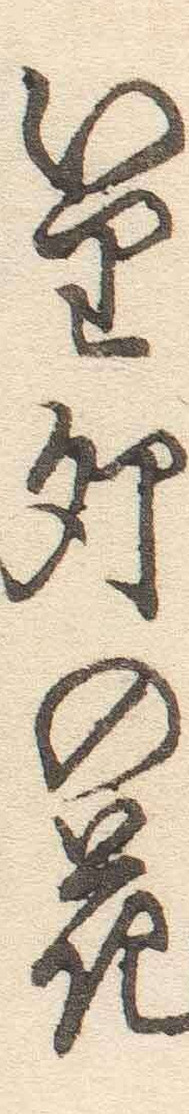いり卯の花
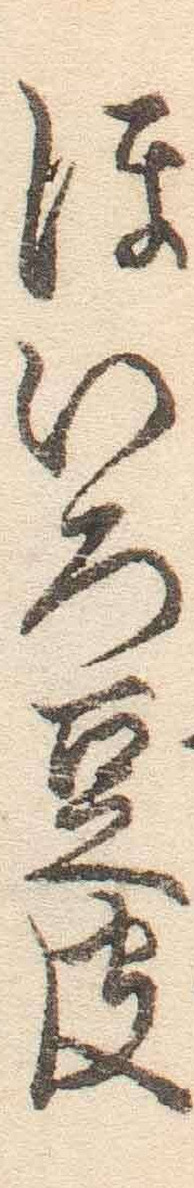ほいろ豆皮
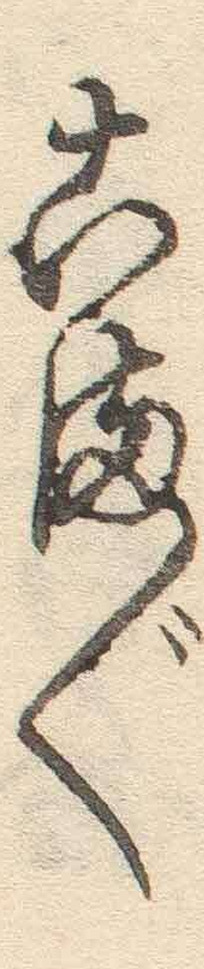こま〴〵
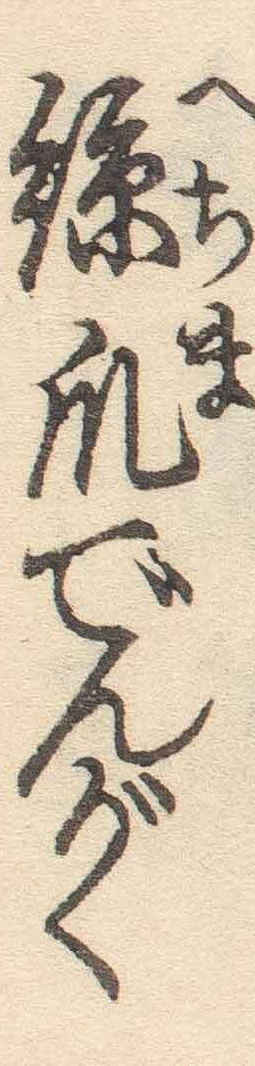糸瓜でんがく
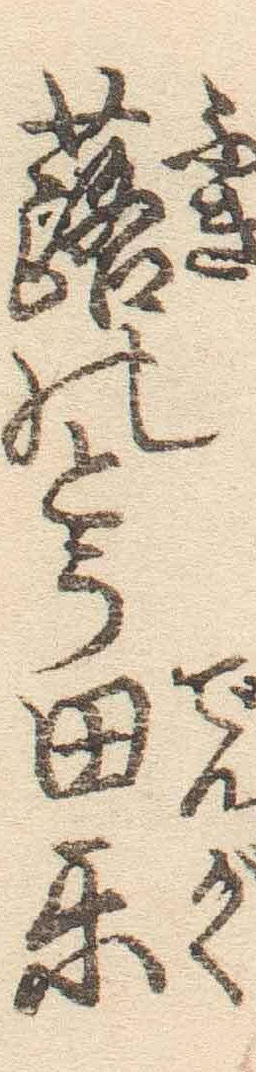蕗のとう田楽
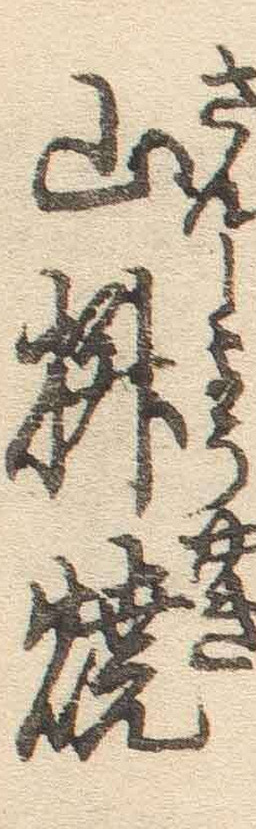山枡焼
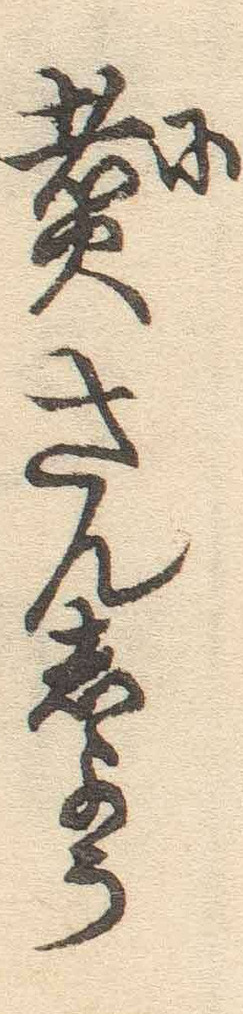煮さんしよう
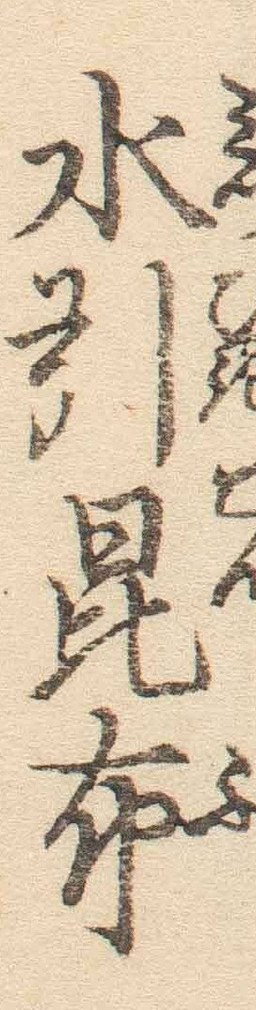水引昆布

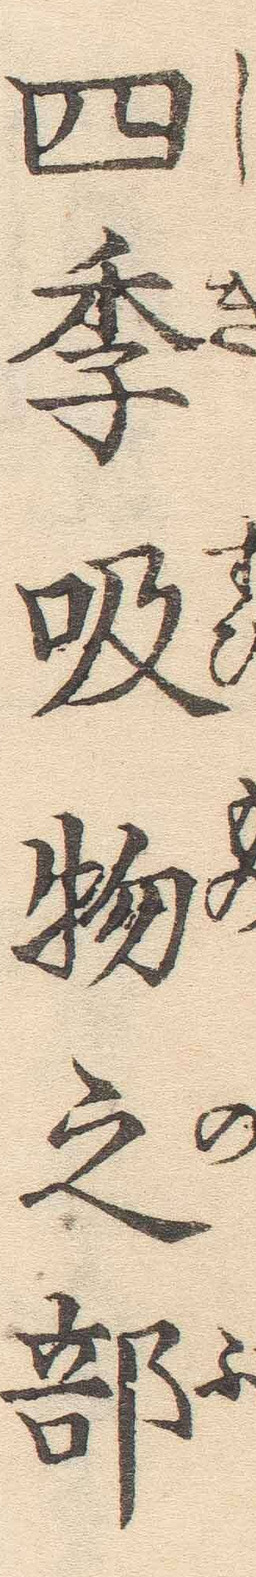四季吸物之部
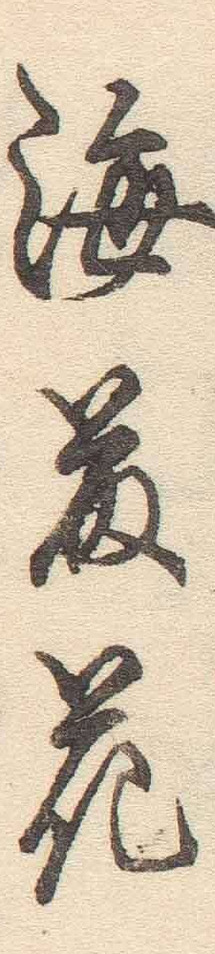海藤花
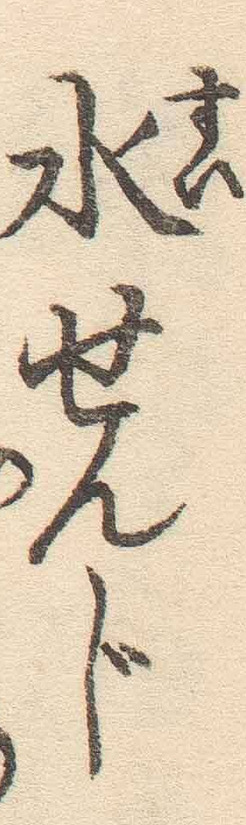水せんじ
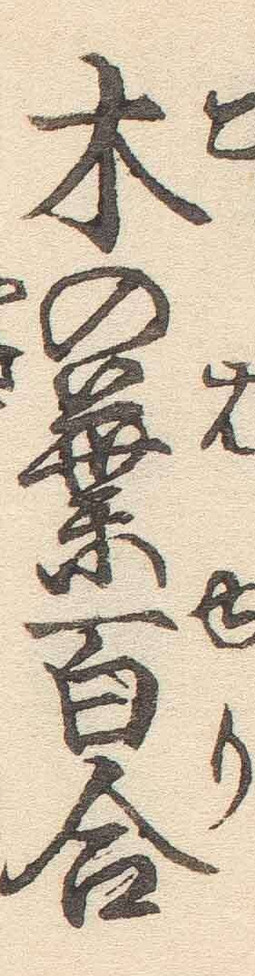木の葉百合
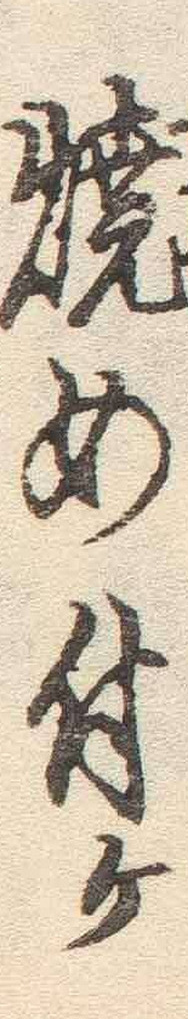焼め付ヶ
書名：料理通
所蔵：東京学芸大学附属図書館 国文学研究資料館
